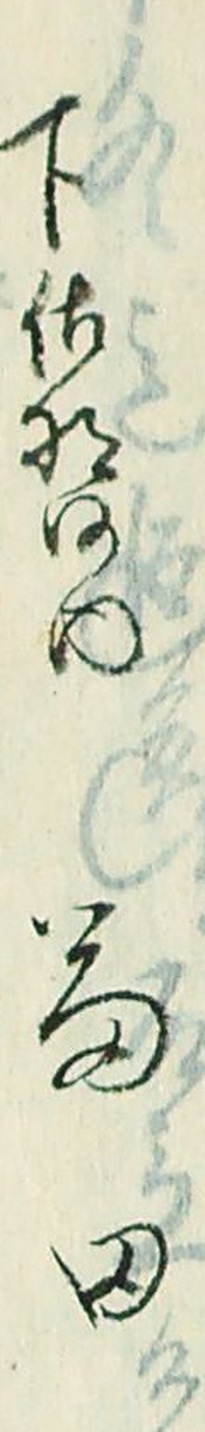下佐那河内冨田
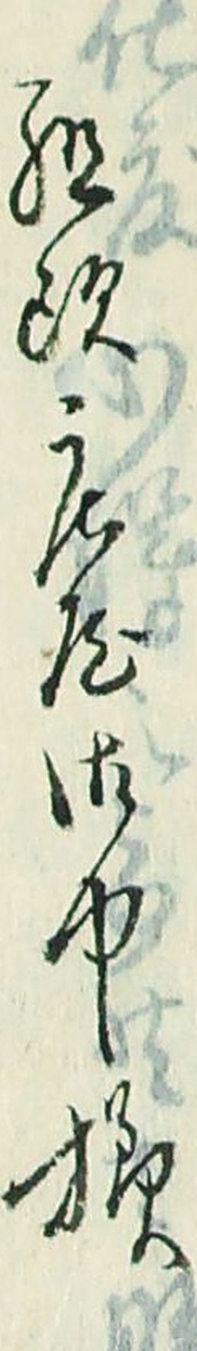組頭庄屋御中様

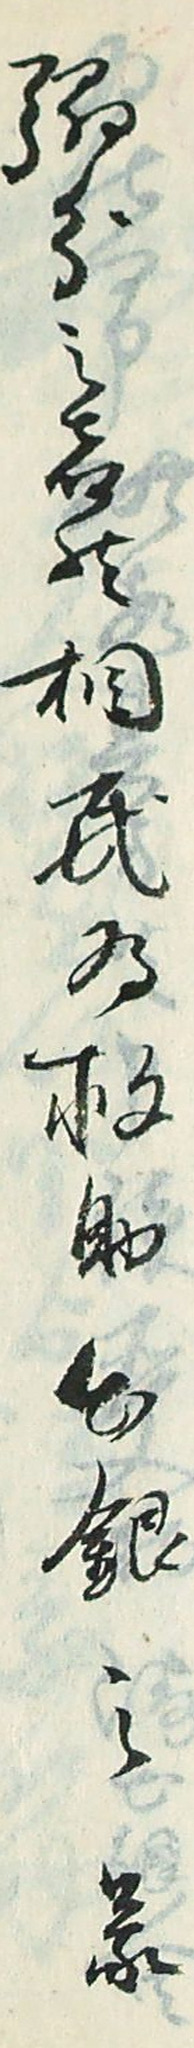郷分之者共相民為救助出銀之義
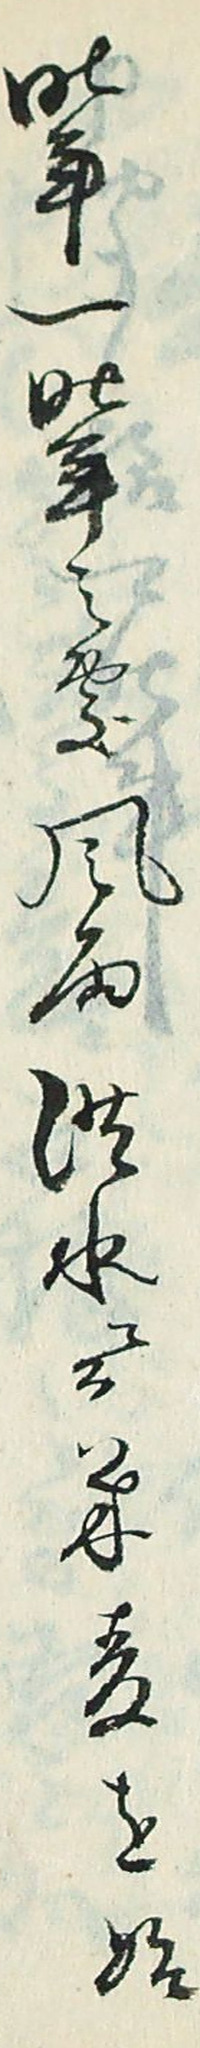昨年一昨年之處風雨洪水ニ而米麦を始
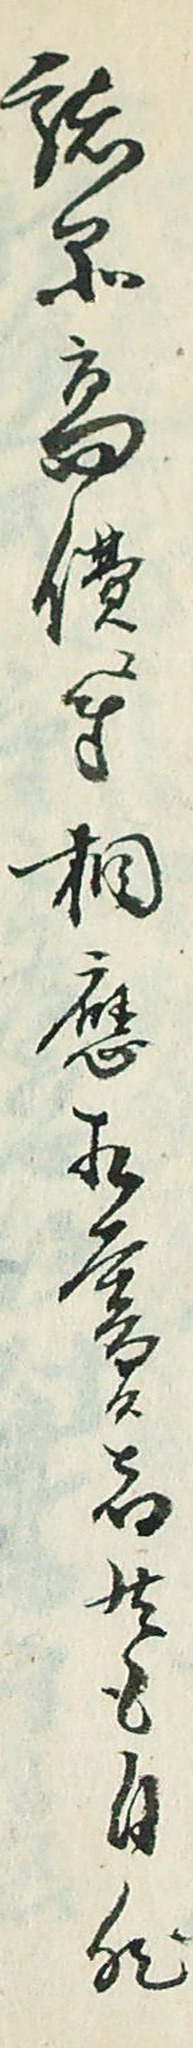諸品高價ニ付相應相暮候者共も自然
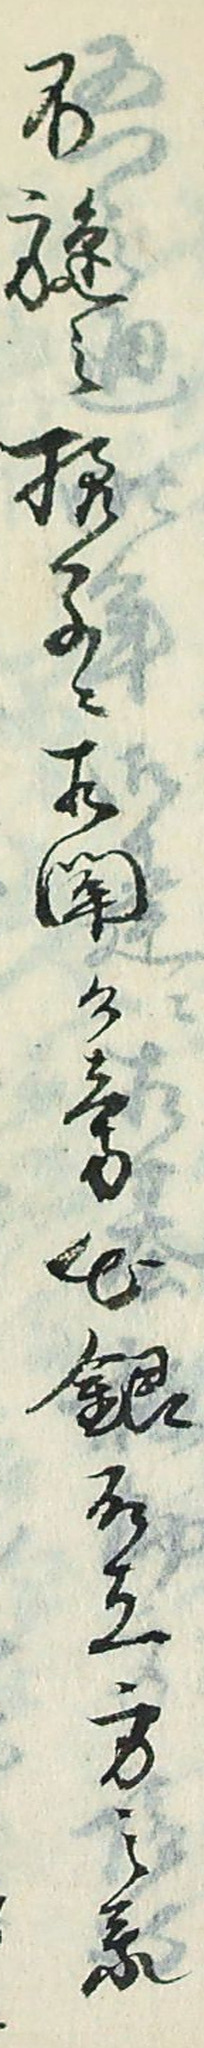不旋之様子ニ相聞候旁出銀取立方之義
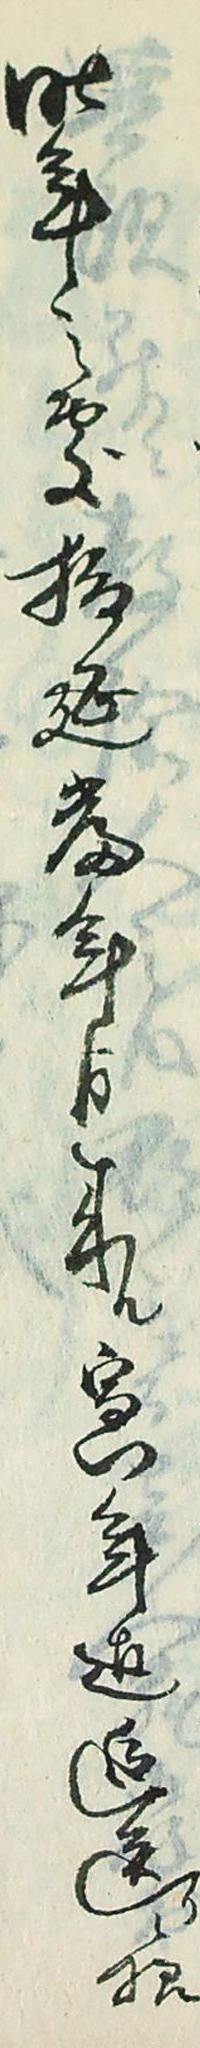昨年之處指延當年ゟ来ル寅年迄追送り候様
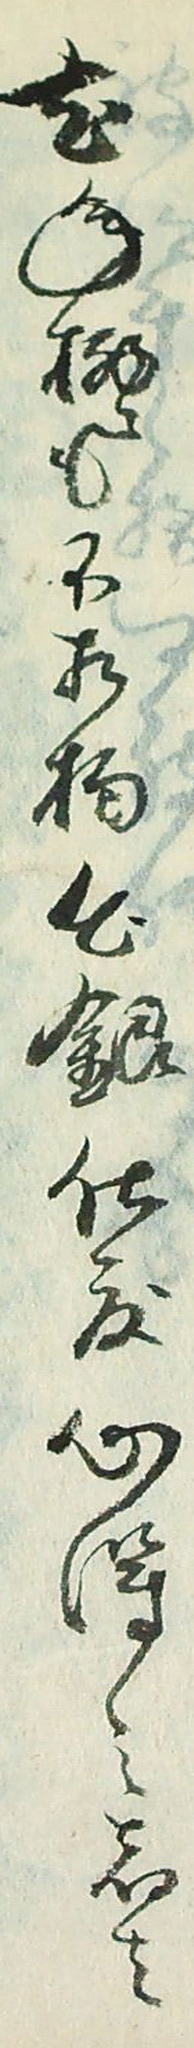尤年柄ニも不相拘出銀仕度心得之者は
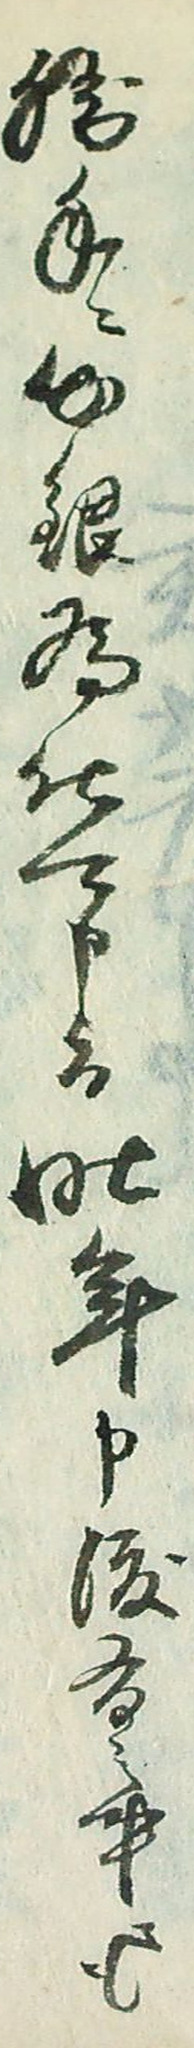勝手ニ出銀為仕可申旨昨年申渡有之事ニも
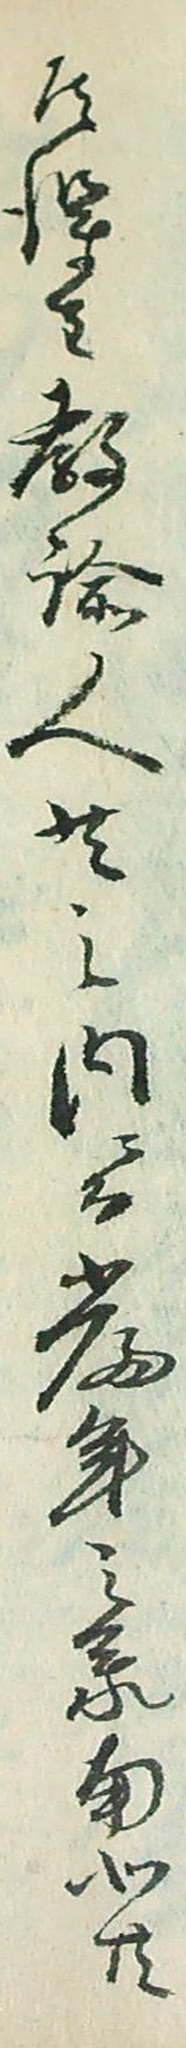候得者教諭人共之内ニ而當年之義南北共
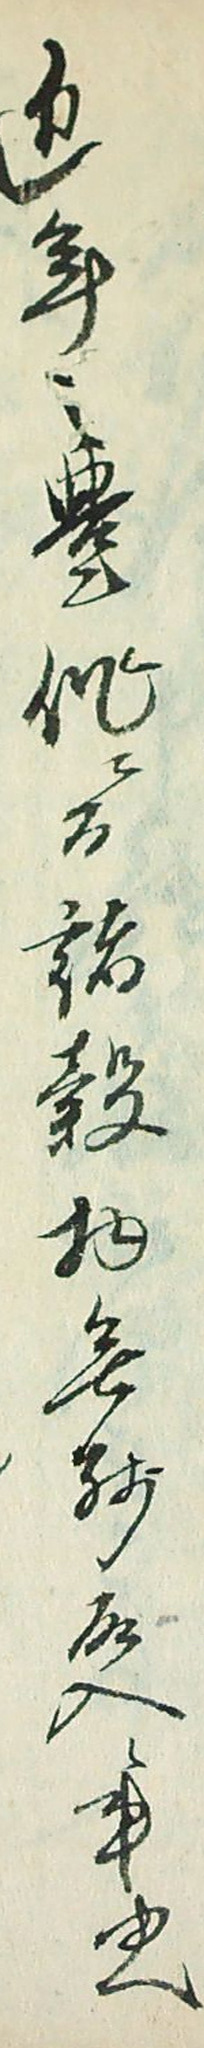近年之豊作ニ而諸穀物無残取入候事ゆへ
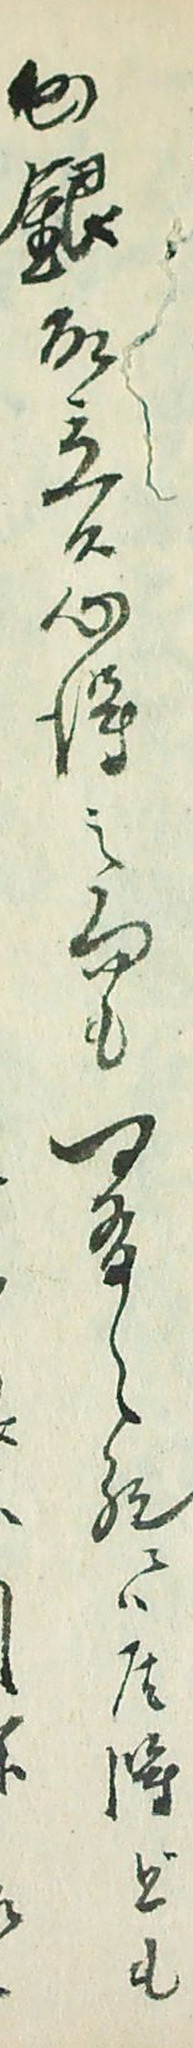出銀取立候心得之向も可有之欤ニハ候得ども
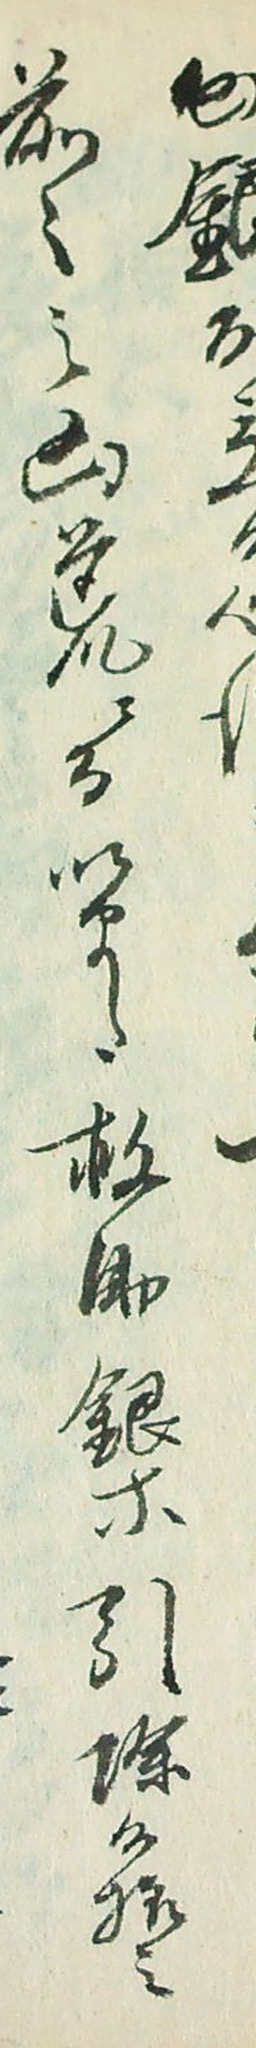前々之凶荒ニ而いまた救助銀等引除候様之
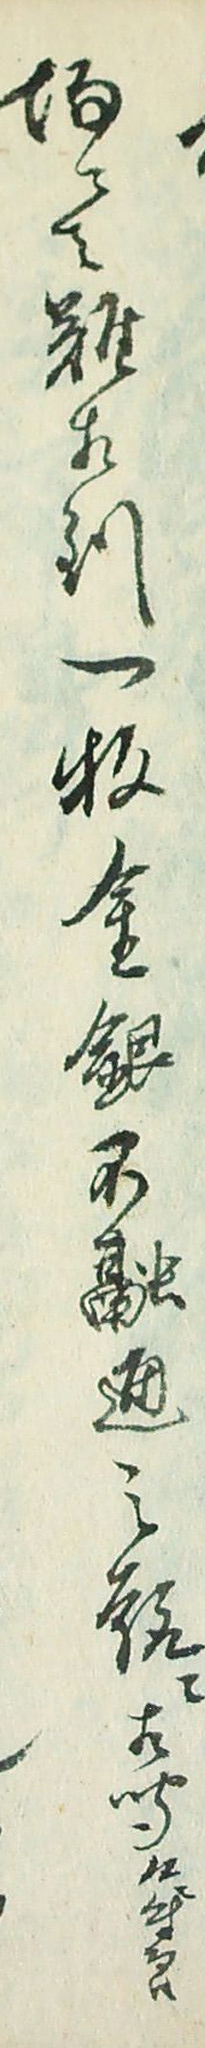場ニ者難相到一牧金銀不融通之趣ニ相聞候ニ付而ハ
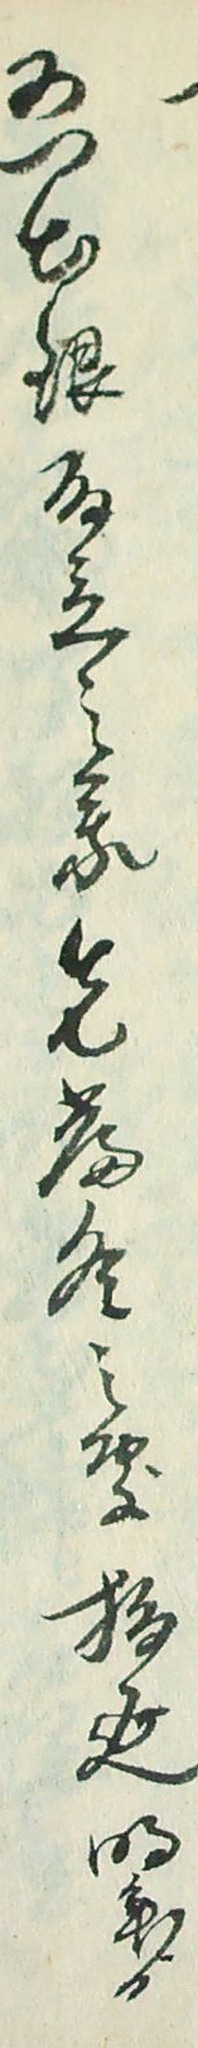右出銀取立之義先當冬之處指延明春ゟ
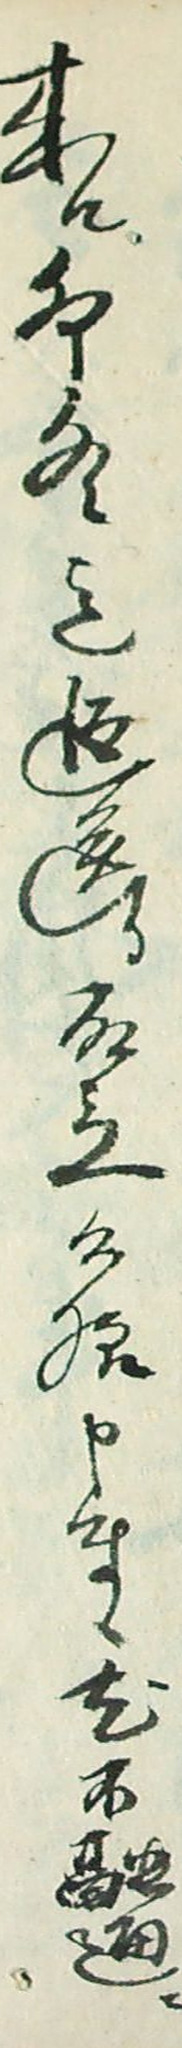来ル卯冬迄追送り取立候様申付候尤不融通ニ
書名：諸御趣意書并御下知向之写
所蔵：鳴門教育大学 Naruto University of Education
